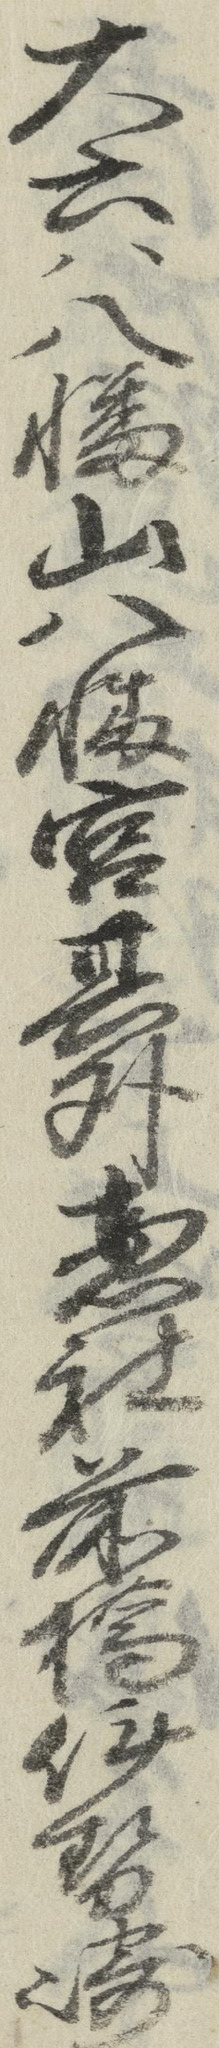大六は八幡山八幡宮其外惣社前橋伊勢崎
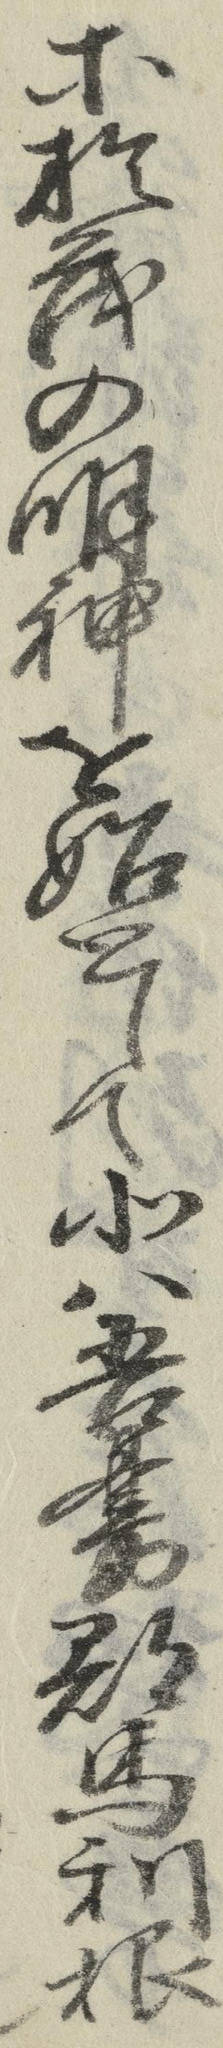等をもの明神を始として北は吾妻郡馬利根
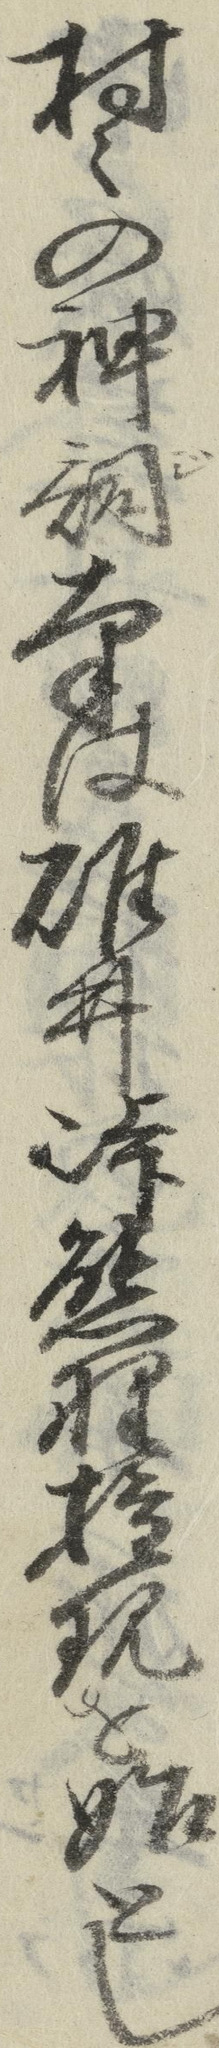村々の神詞東は碓井峠熊野権現を始とし

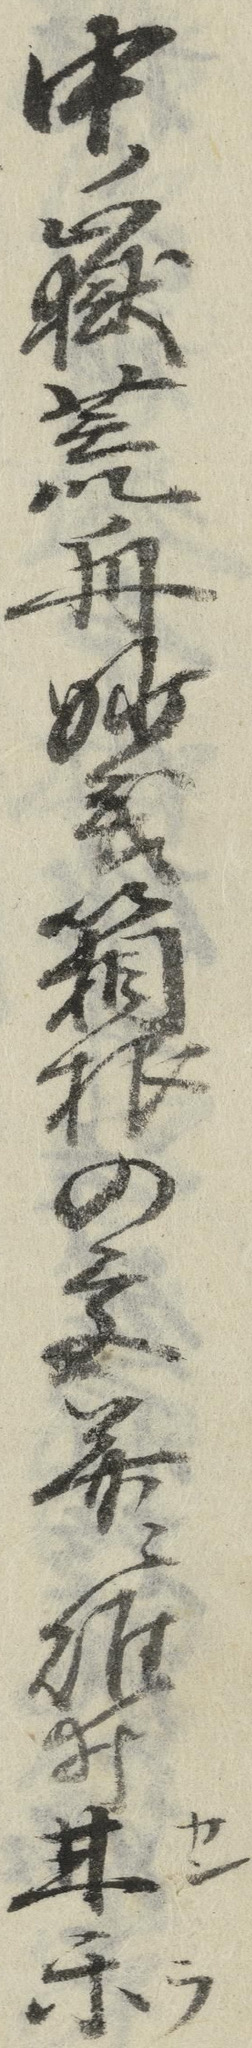中ノ嶽荒丹妙義箱根の宮幷に碓井甘楽
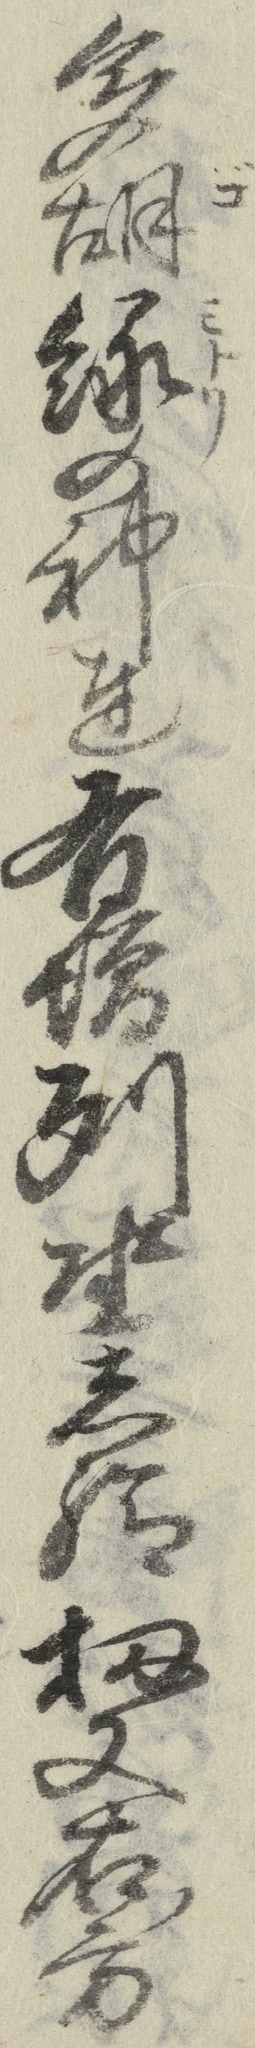多胡緑の神達有増列座し給扨又右方
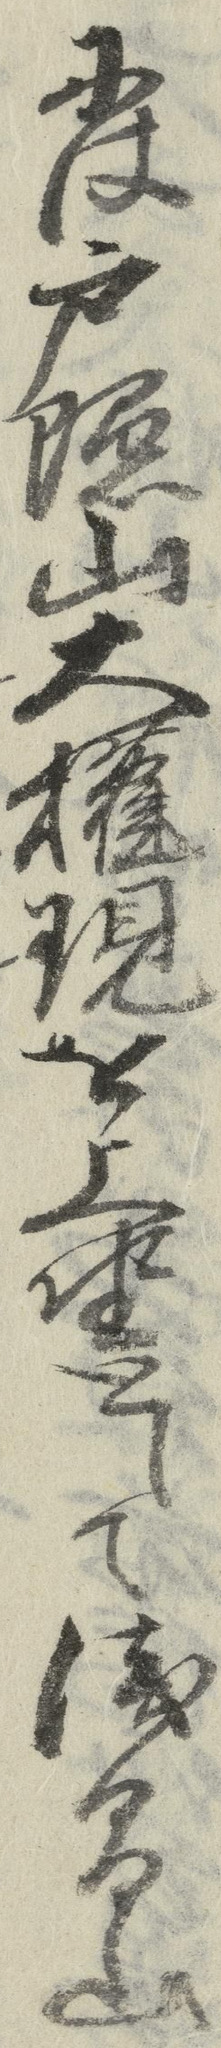には戸隠山大権現を上坐として浅間山
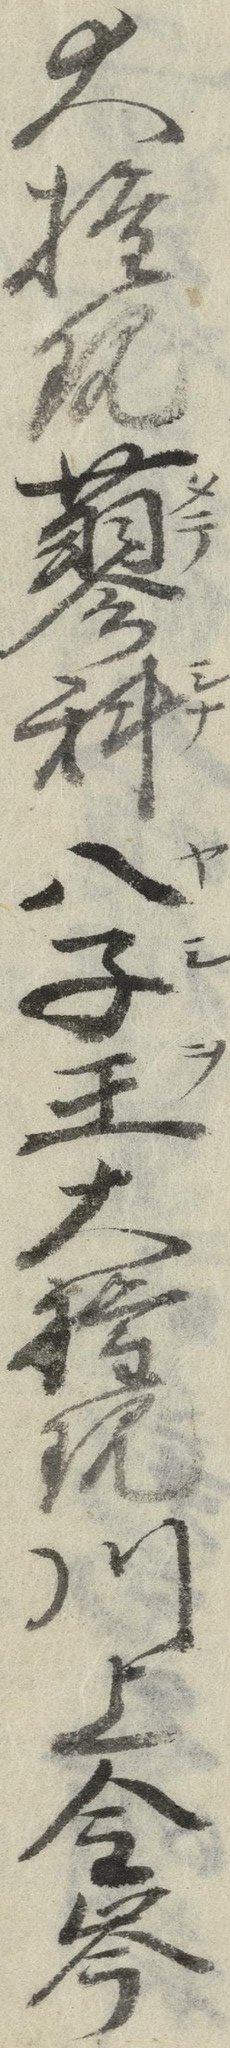大権現蓼科八子王大権現川上金岑
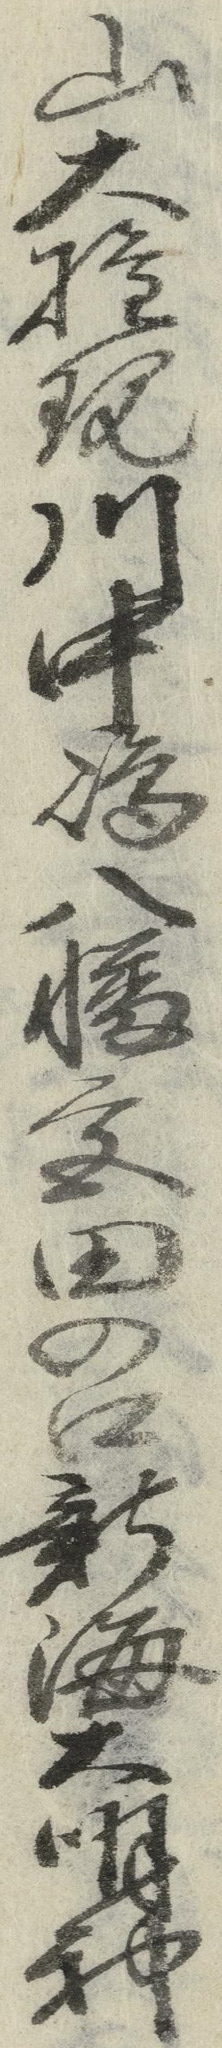山大権現川中嶋八幡宮田の口新海大明神
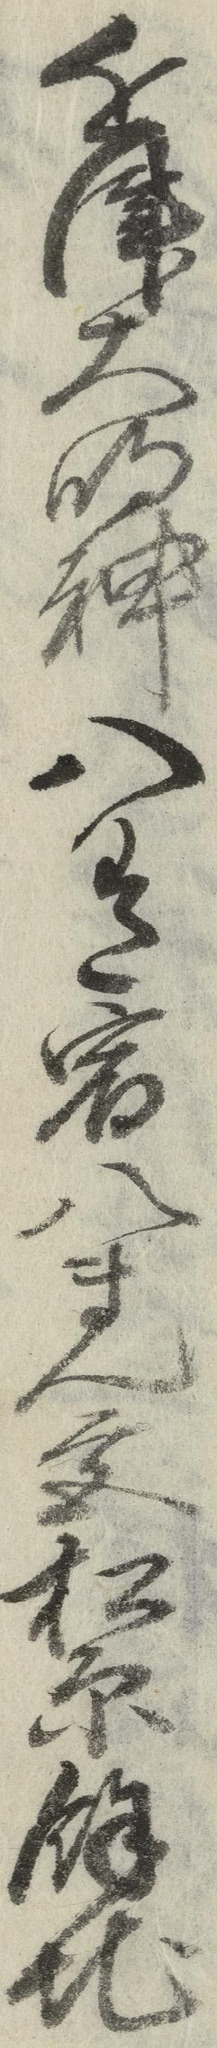近津大明神八わた宿八まん宮松原餘地
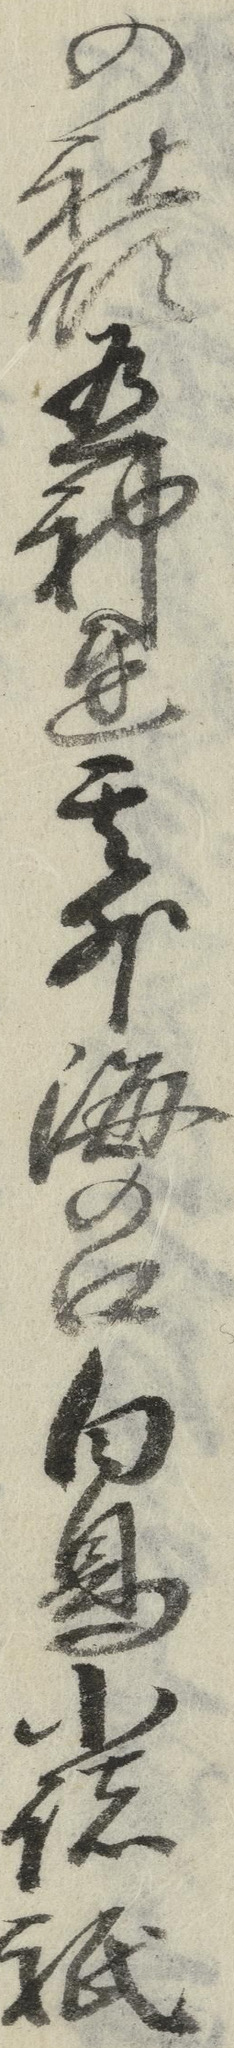の社領有神達其外海の口白鳥小諸祇
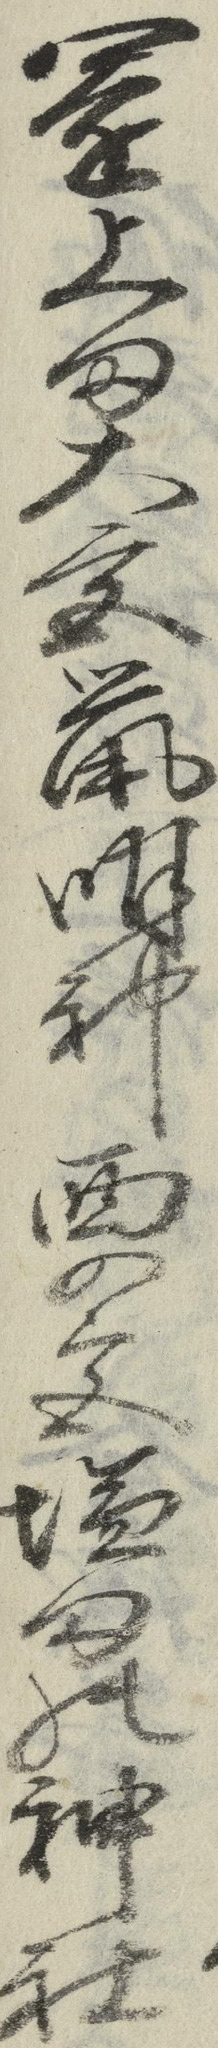園上田大宮鼠明神西の宮塩田の神社
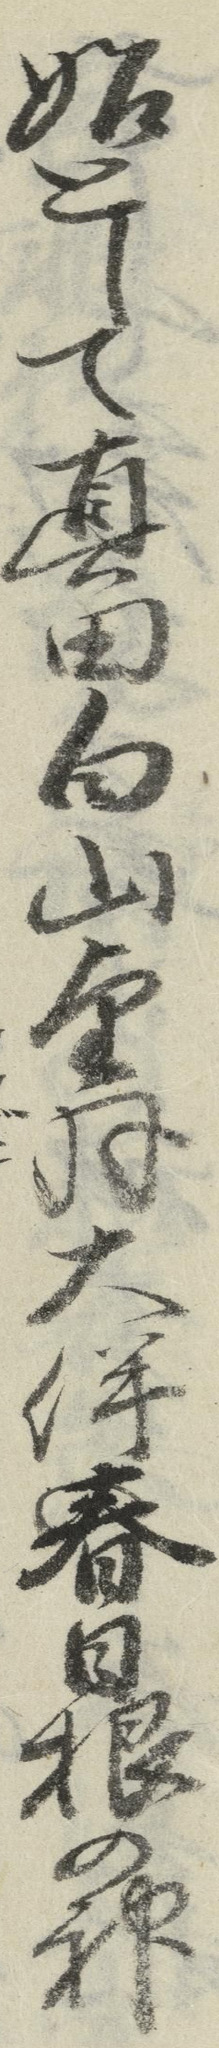始として真田白山望月大伴春日根の神
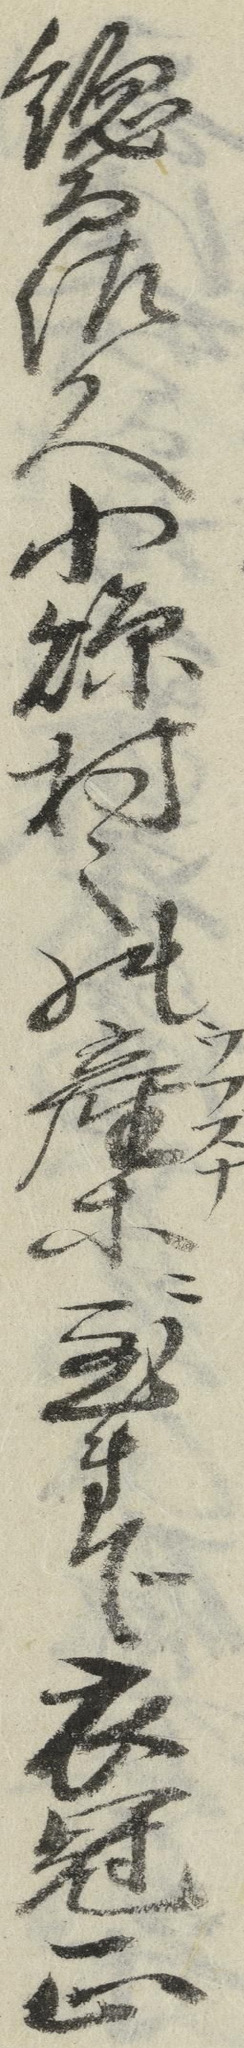総而佐久小縣村々の産等に至まで衣冠正
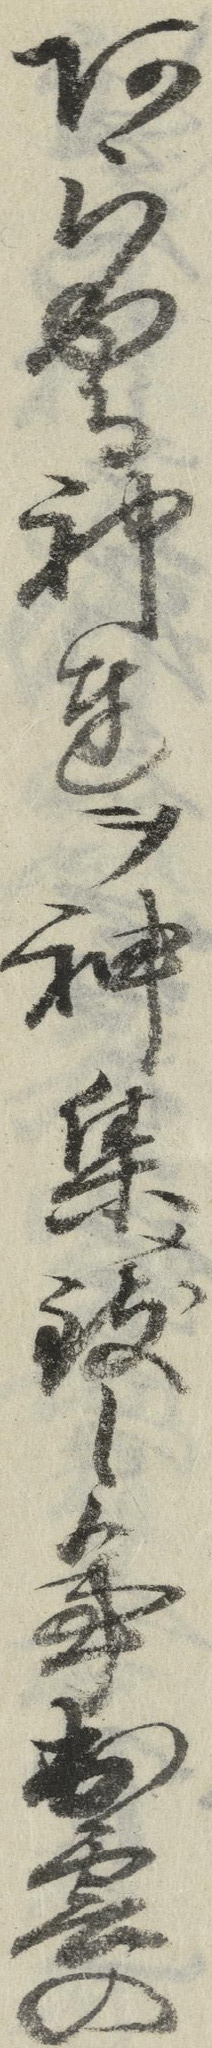あらゆる神達ヲ神集致し候事出雲の
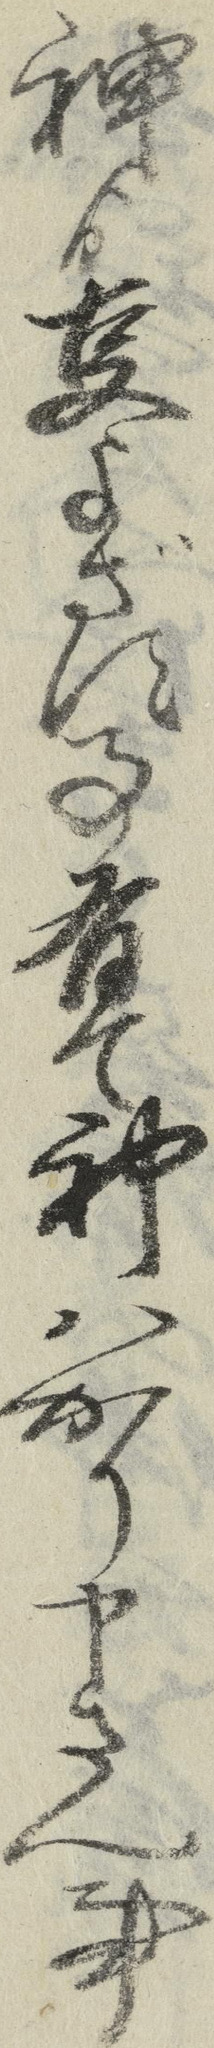神ゟ事よざす事有て神はかり申さん事
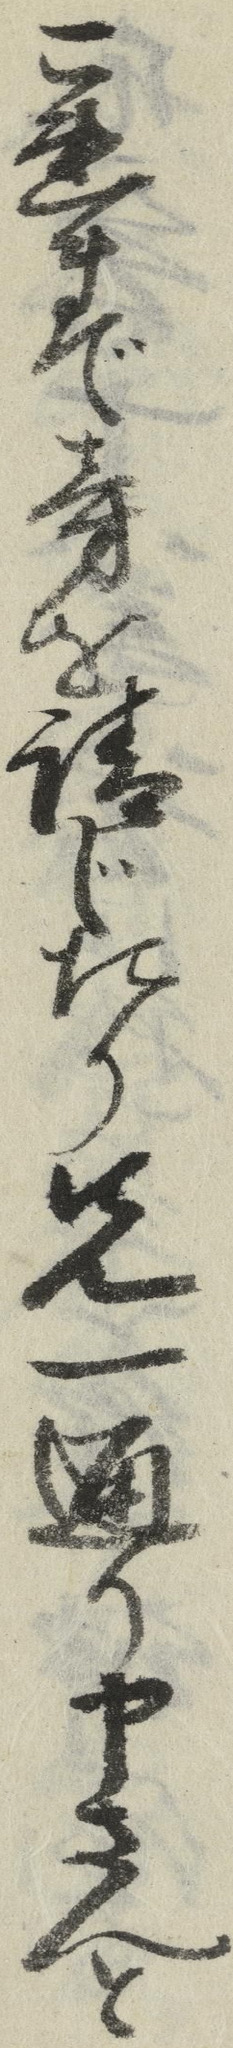これまで旁を請じたり先一通り申さんと
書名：浅間大焼騒動記　上
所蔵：東京大学地震研究所図書室 Earthquake Research Institute Library, The University of Tokyo, JAPAN
